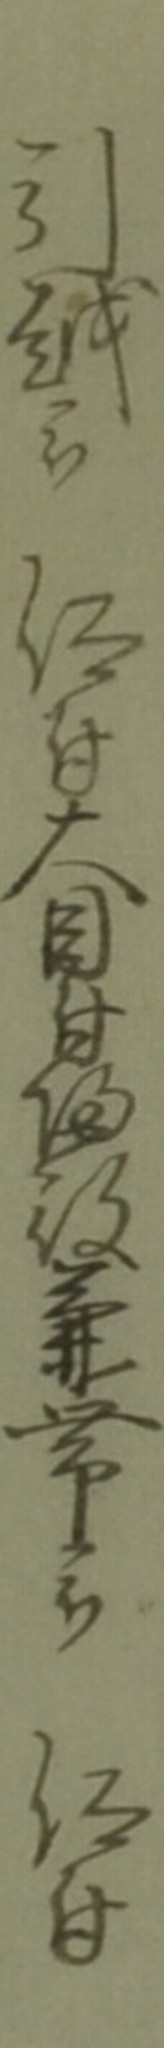引越被仰付大目付帰役兼帯被仰付
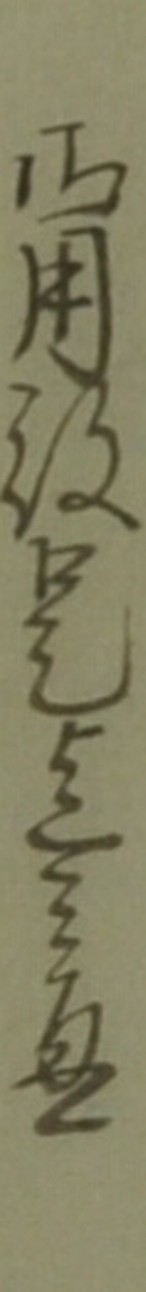御用役是迄之通
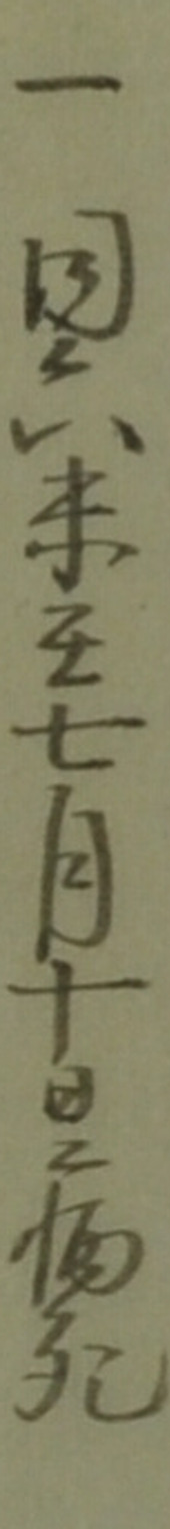一同六未閏七月十日病死
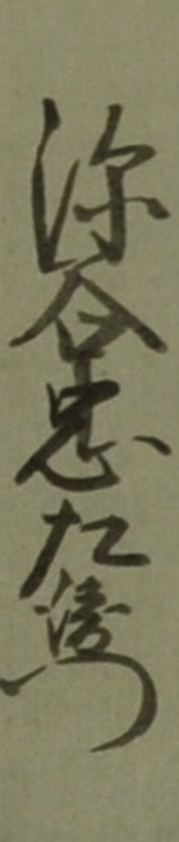深谷忠左衛門
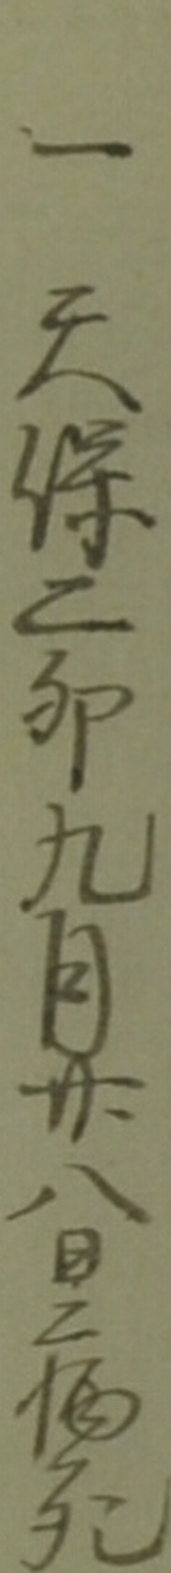一天保二卯九月廿八日病死
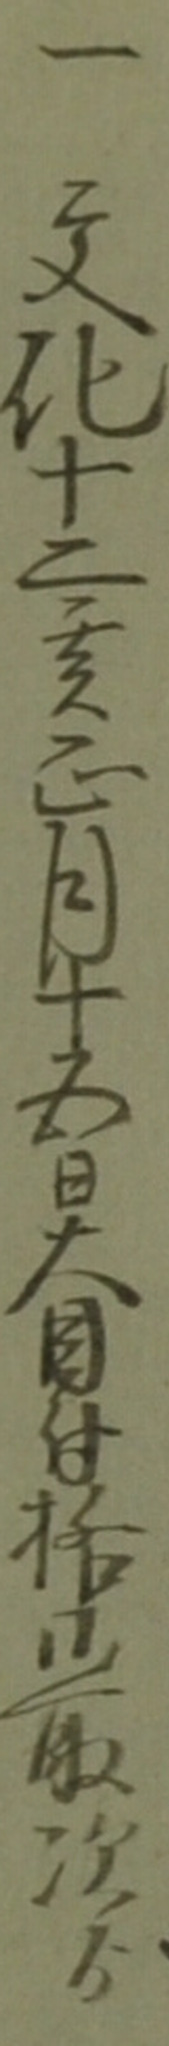一文化十二亥正月十五日大目付格御取次ゟ
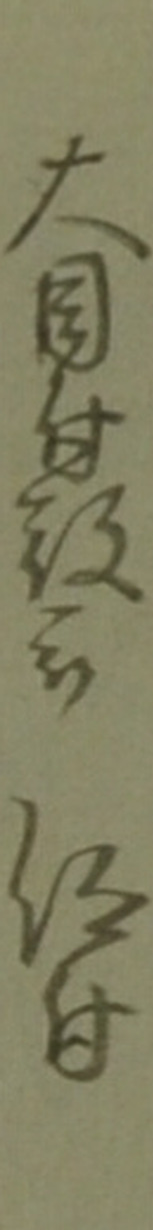大目付役被仰付
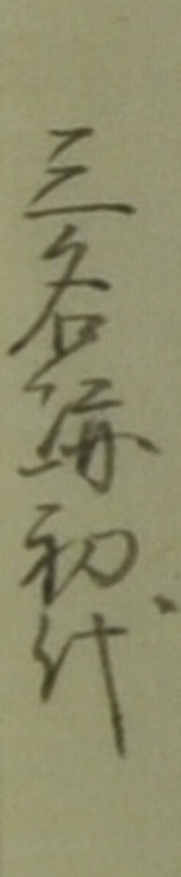三名跡初代

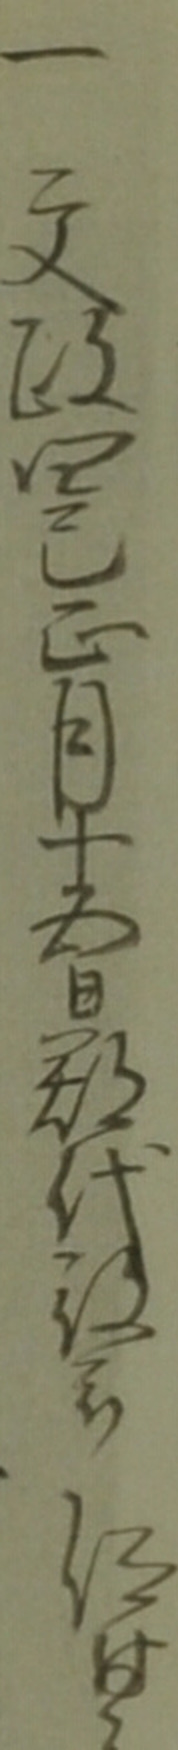一文政四己正月十五日郡代役被仰付之
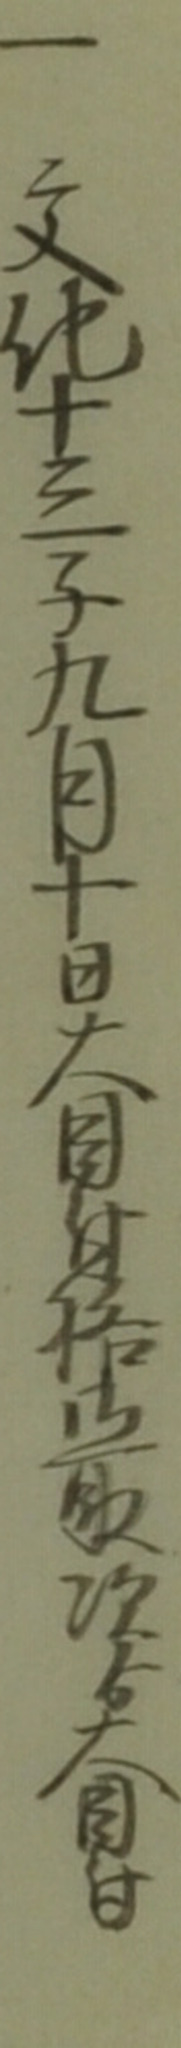一文化十三子九月十日大目付格御取次ゟ大目付
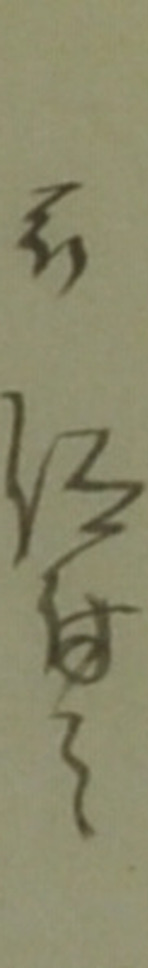被仰付之
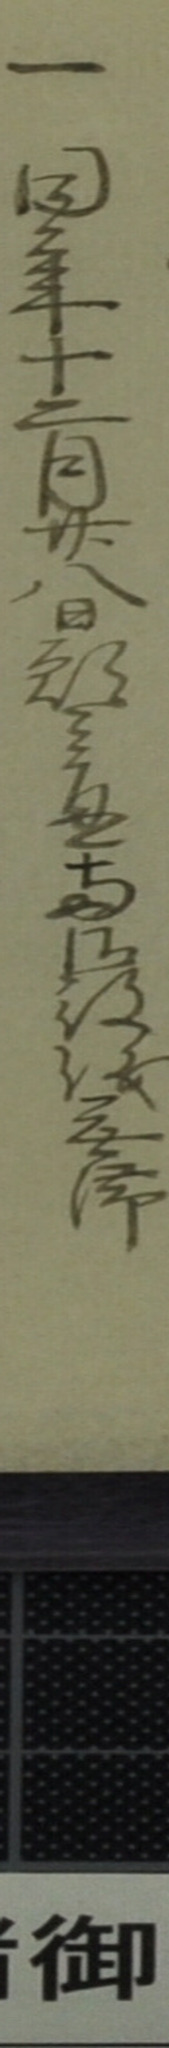一同年十二月廿八日願之通両御役儀無滞
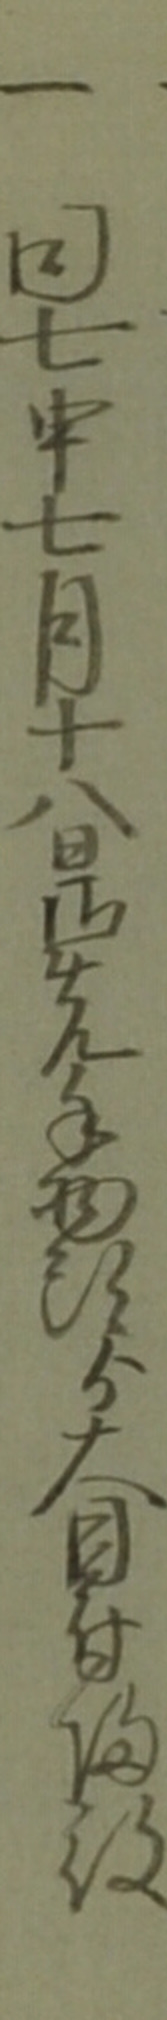一同七申十八日御先手物ゟ大目付帰役
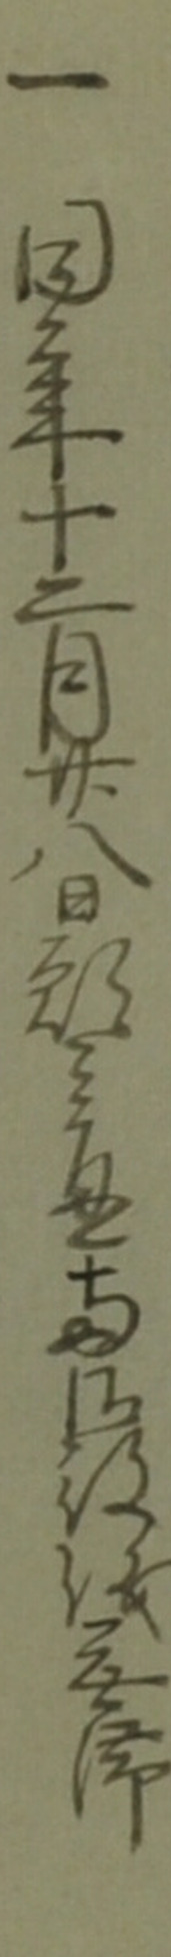一同年十二月廿八日願之通両御役儀無滞
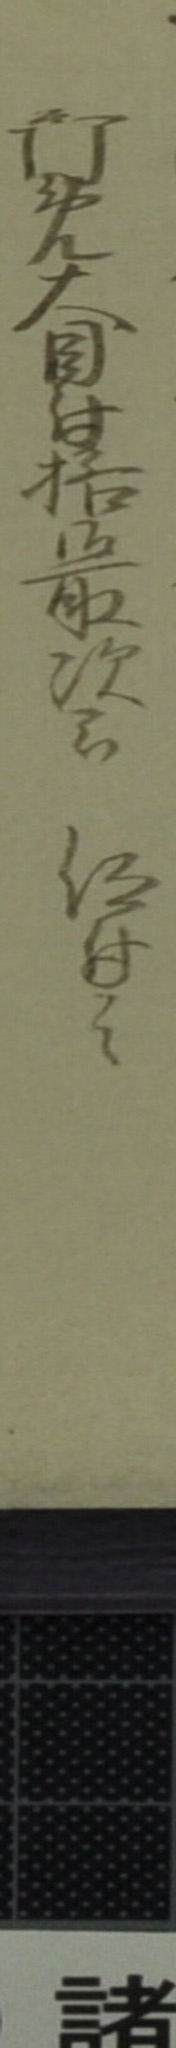御免大目付格御取次被仰付之
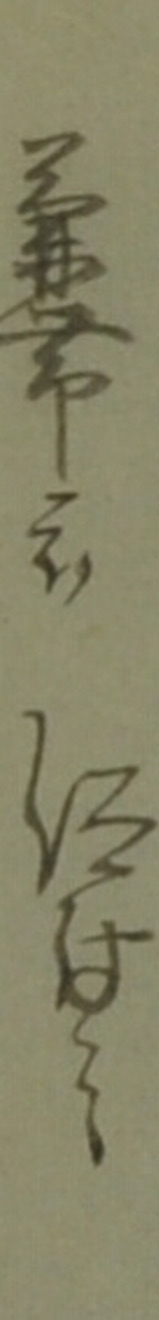兼帯被仰付之
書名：諸御役代々録（三）
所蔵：伊那市立高遠町図書館・合同会社AMANE
